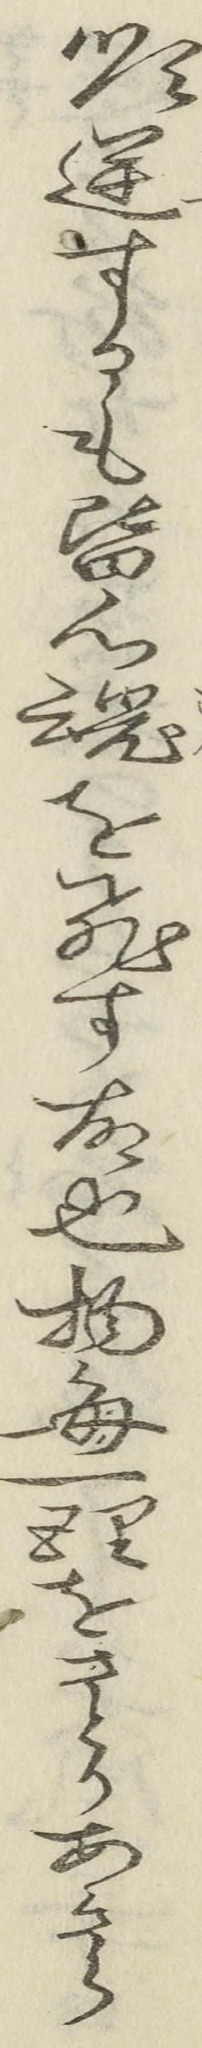順逆するも皆心魂を飛す故也物毎一理をさとりあきら
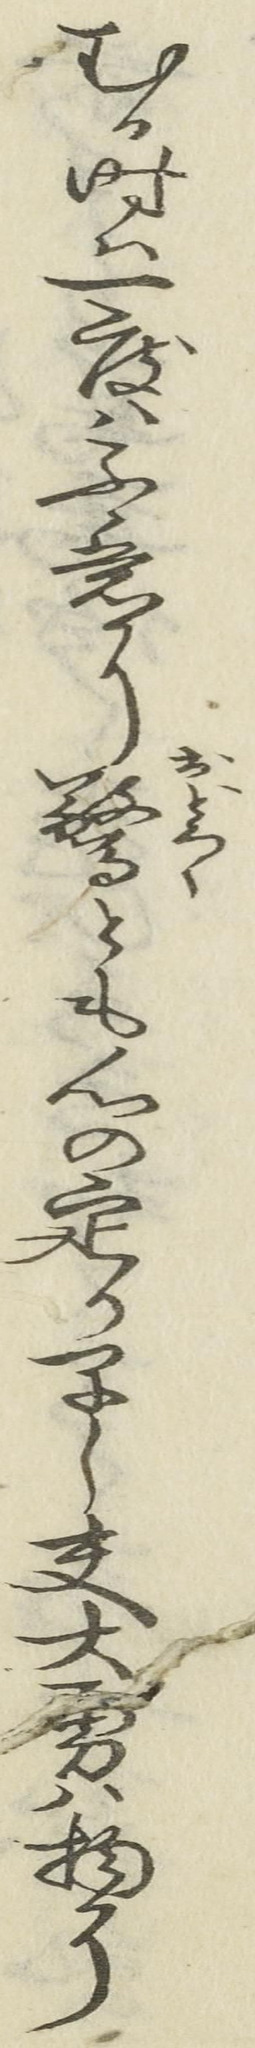むる時は一度は不意に驚とも心の定り早く夫大勇は物に
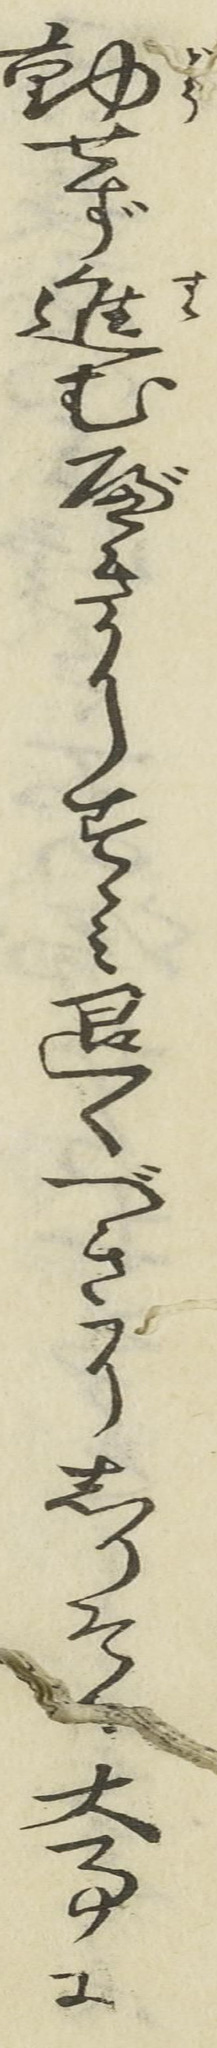動せず進むべきにすゝみ退くべきにしりそく大事に
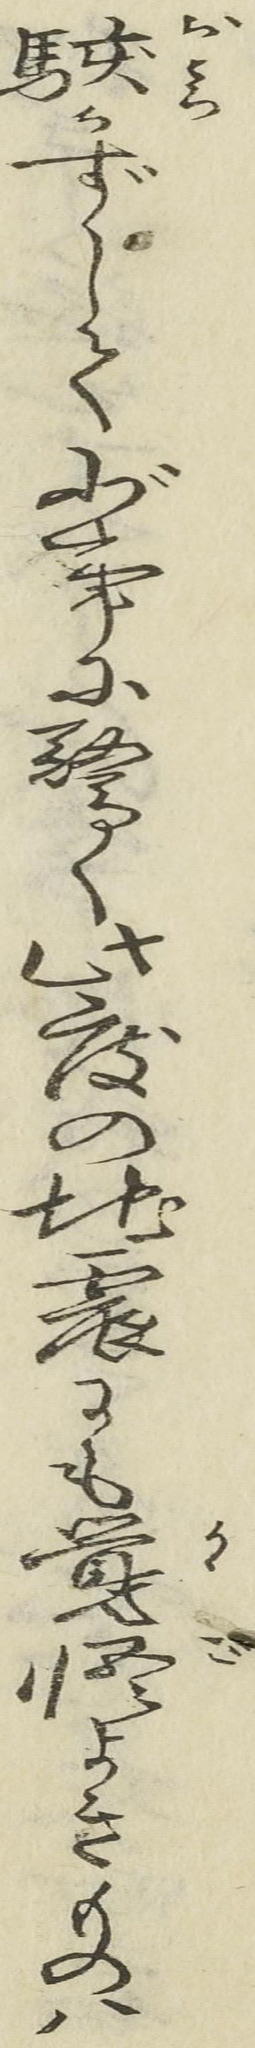駭かずして少事に驚く此度の地震にも覚悟よきものは
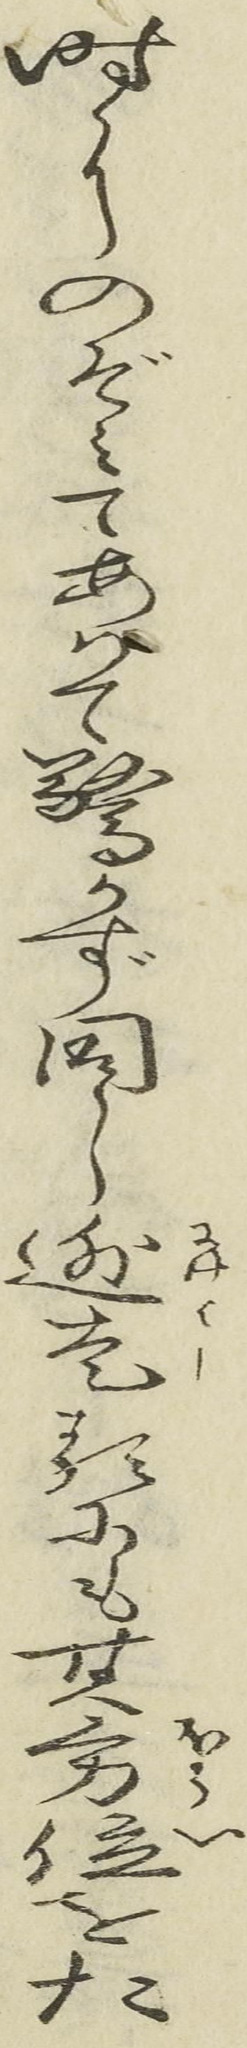時にのぞみてあはて驚かず同し逃走るにも其方位をた
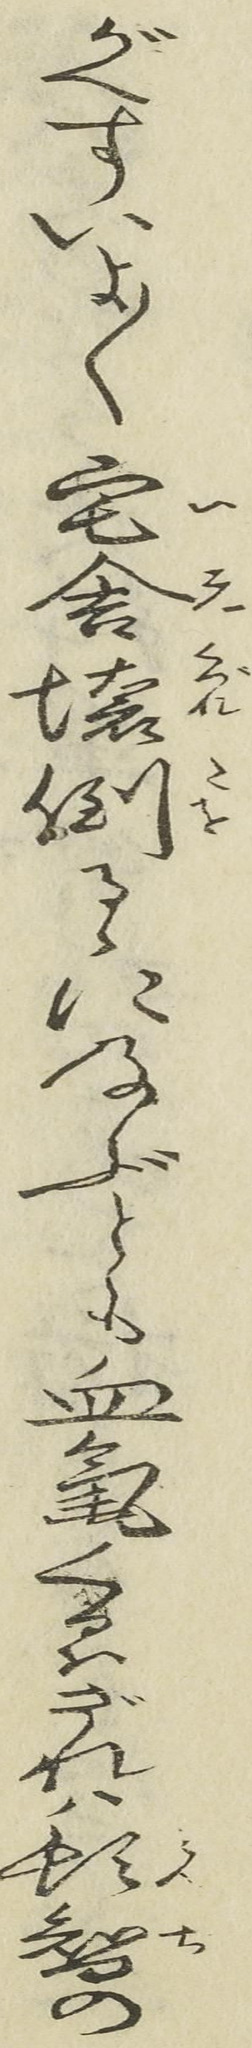がへすいよ〳〵宅舎壊倒るゝにおよぶとも血気くるはざれは頓智の
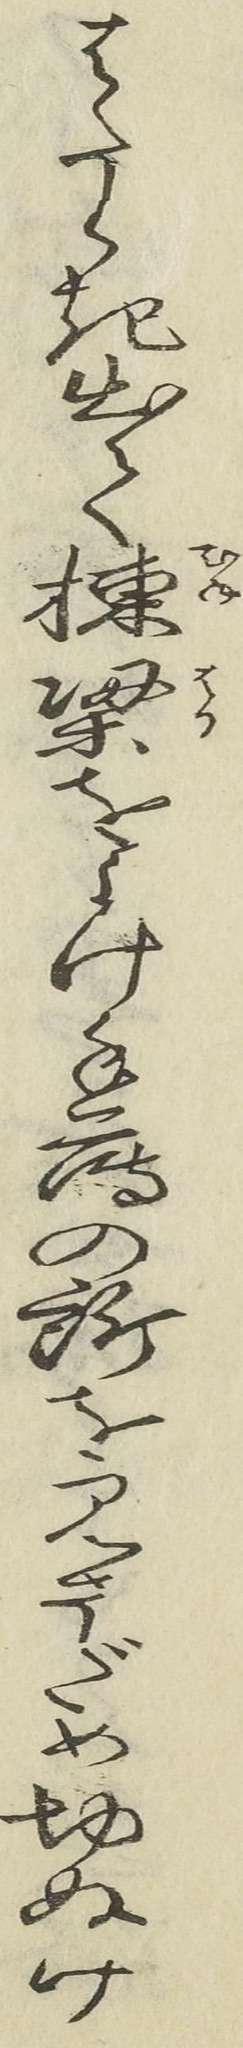はたらき出て棟梁をよけ手薄の所を見さだめ切りぬけ
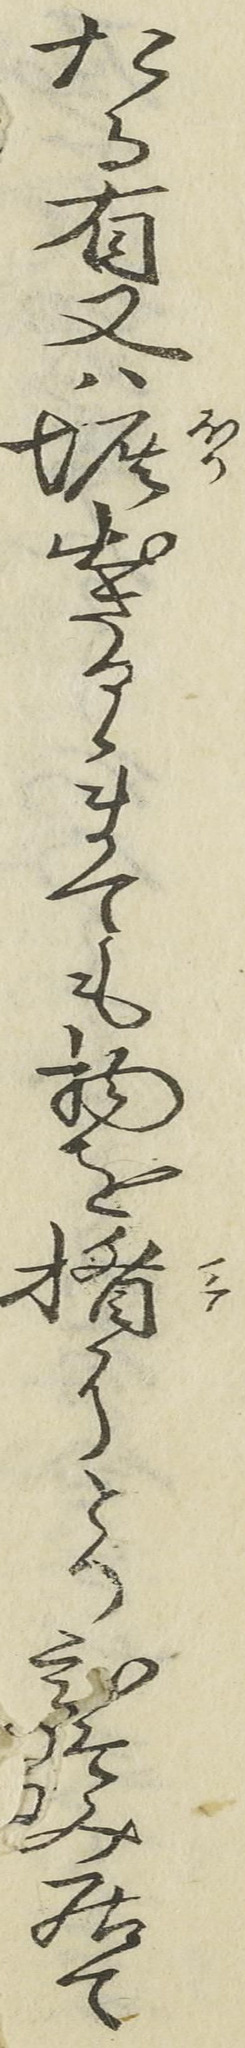たる有又は堀出さるゝまても物を楯にとりひそみ居て
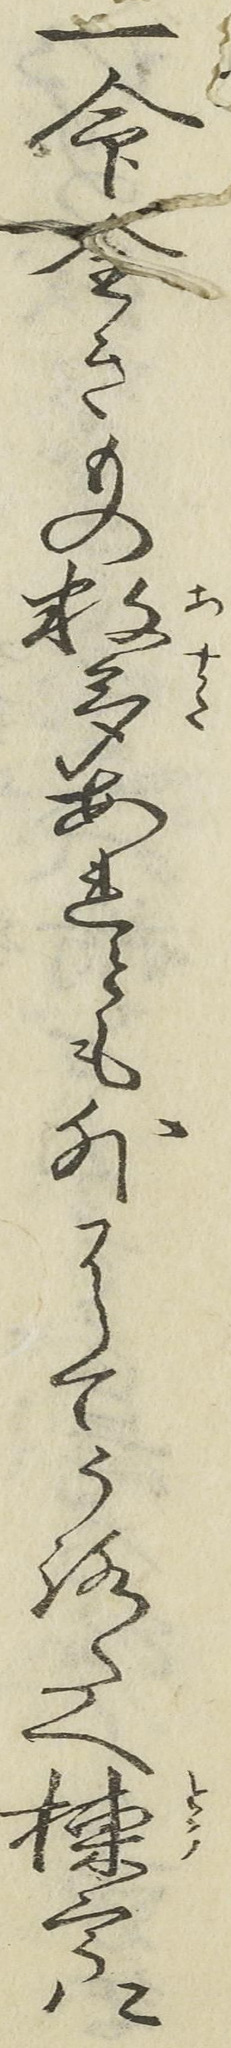一命全きもの数多あれとも外にてうろたへ棟宇に
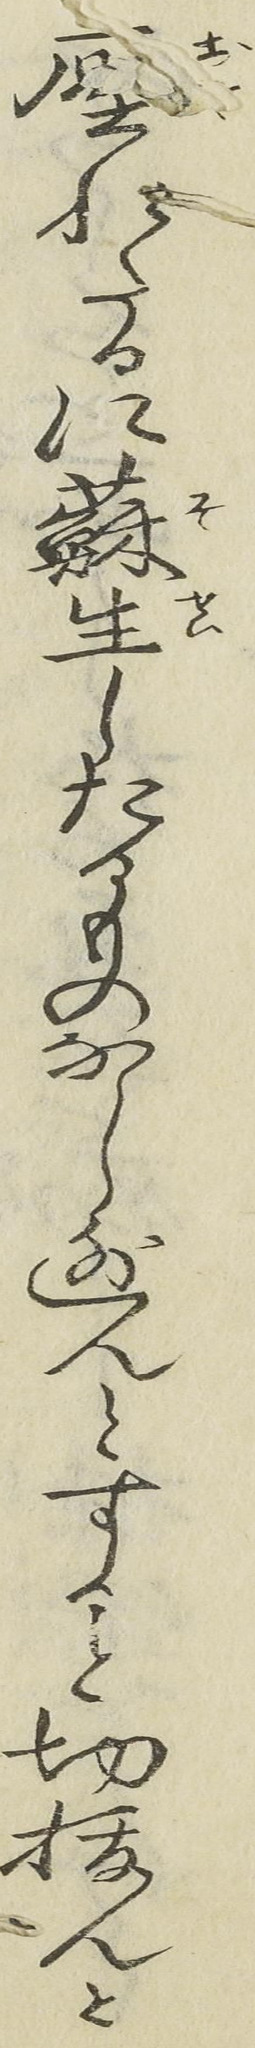圧れたるに蘇生したるものなし逃げんとすると切抜んと
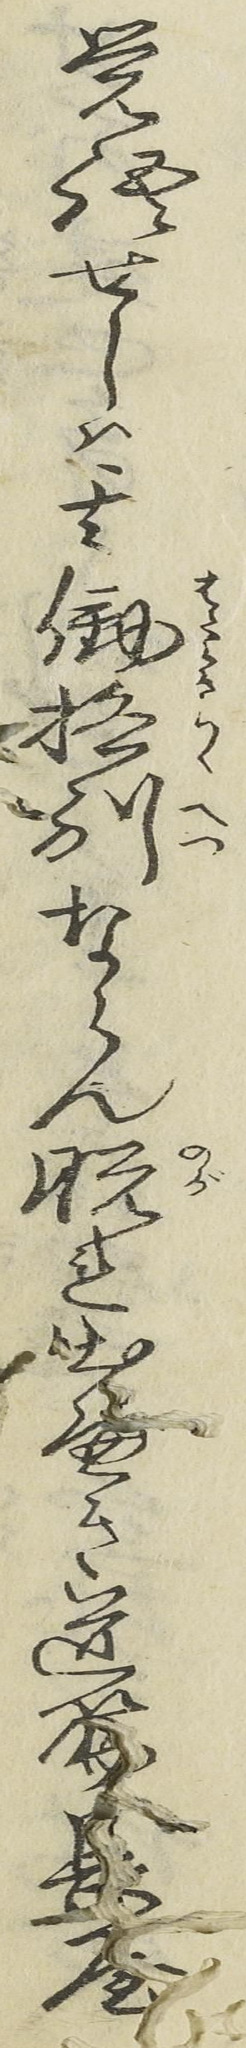覚悟せしは其働格別ならん脱れ出べき道筋長屋

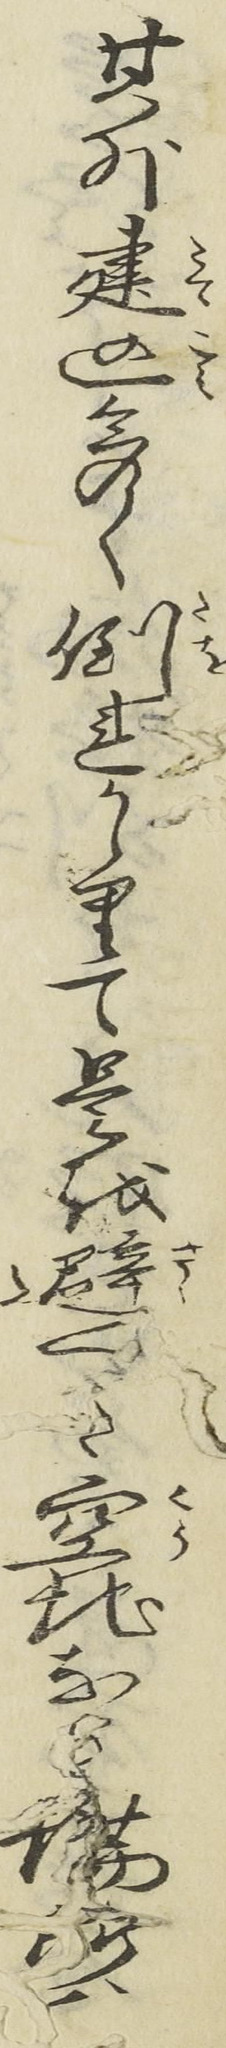其外建込多く倒れたりて是を避くべき空地なき場所は
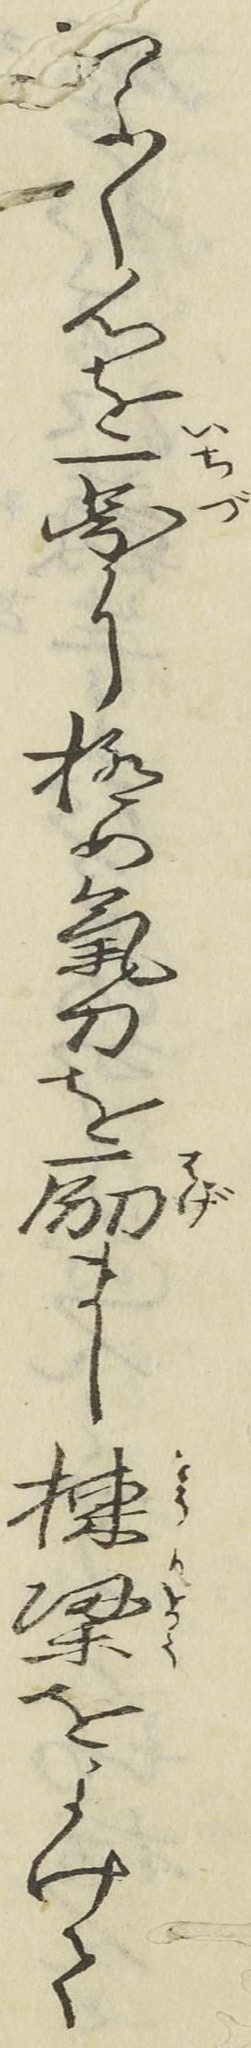早く心を一図に極め気力を励まし棟梁をよけて
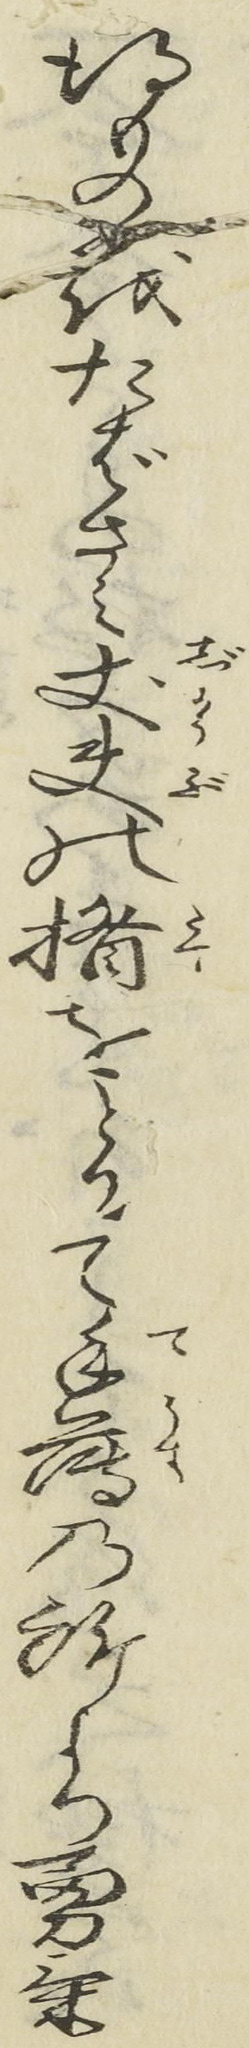得ものをたばさみ丈夫の楯をとりて手薄の所より勇気
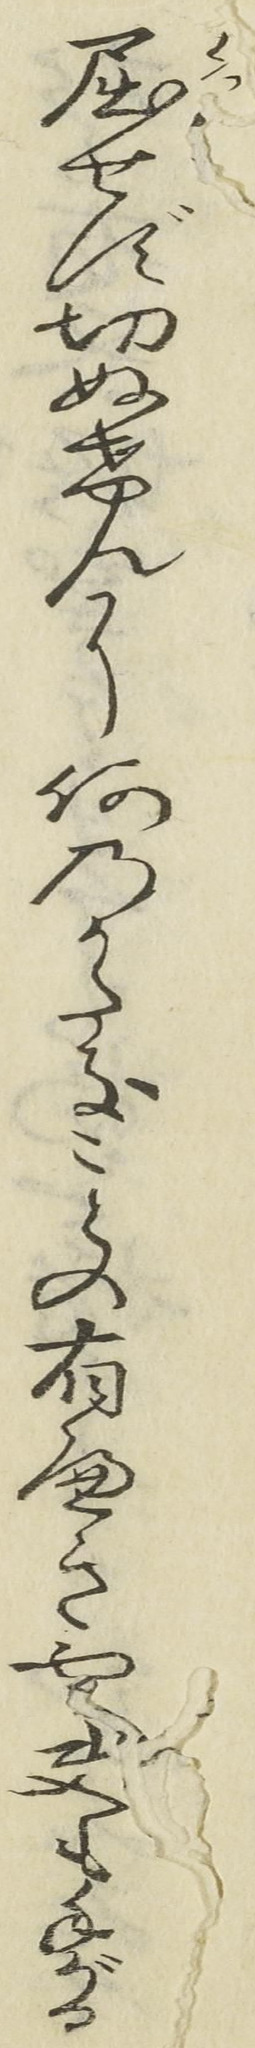屈せず切ぬけんに何のかたきことの有べきや夫も手がる
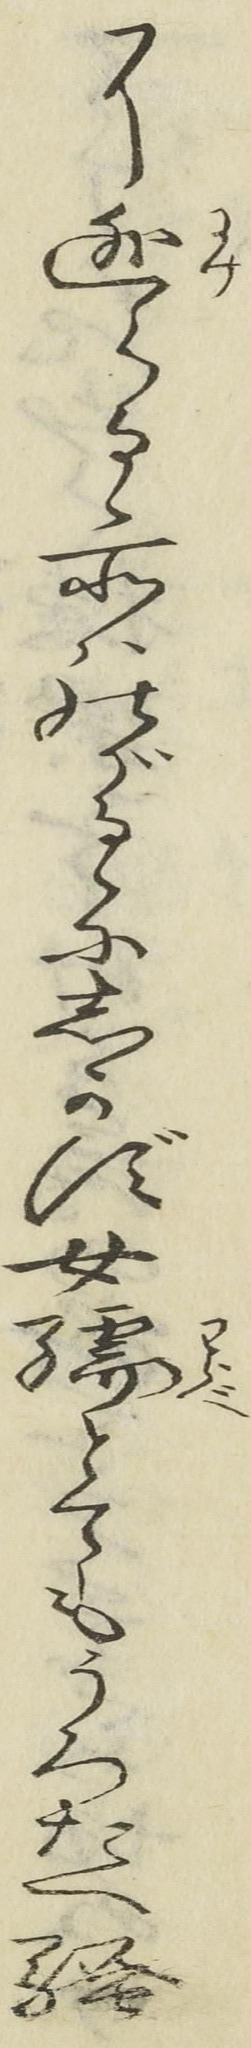に逃たるゝ所はのがるゝにしかず女孺とてもうろたへ騒
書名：震雷考説　全
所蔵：東京大学地震研究所図書室 Earthquake Research Institute Library, The University of Tokyo, JAPAN
